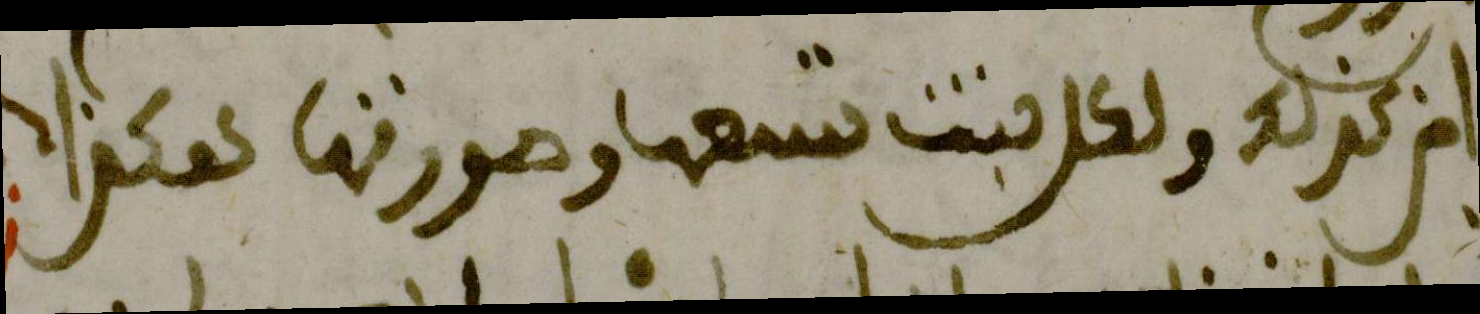ابن كذلك ولكل بنت تسعها وصورتها هكذا
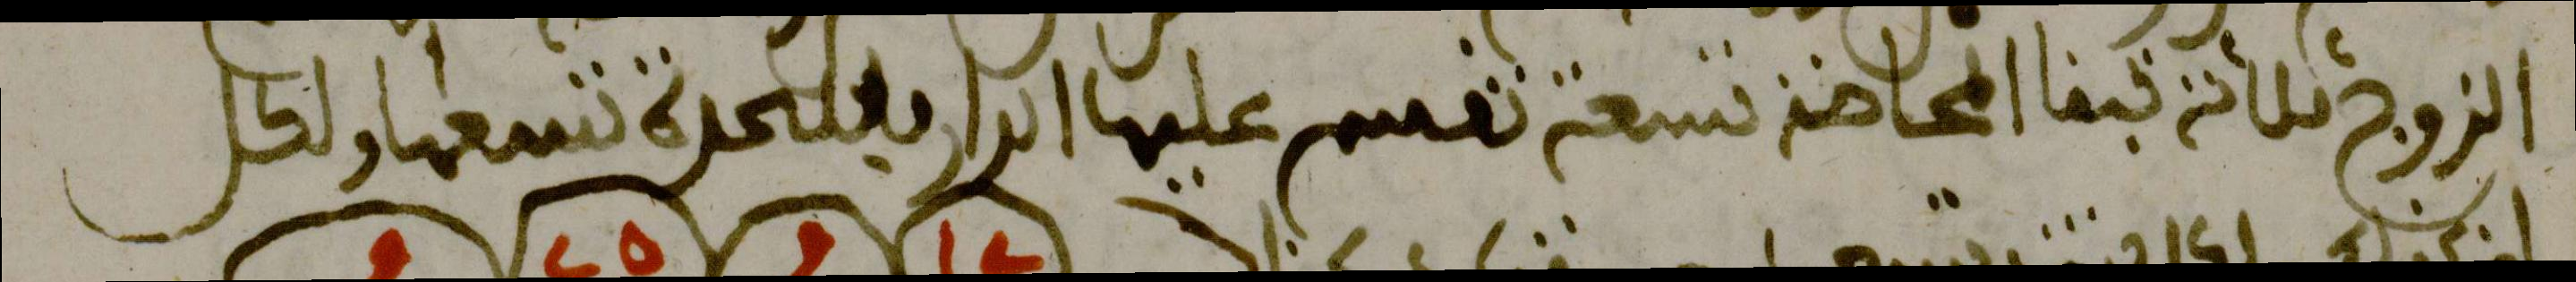الزوج ثلاثة تبقا المحاصة تسعة تقسم عليها الدار فللجدة تسعها ولكل
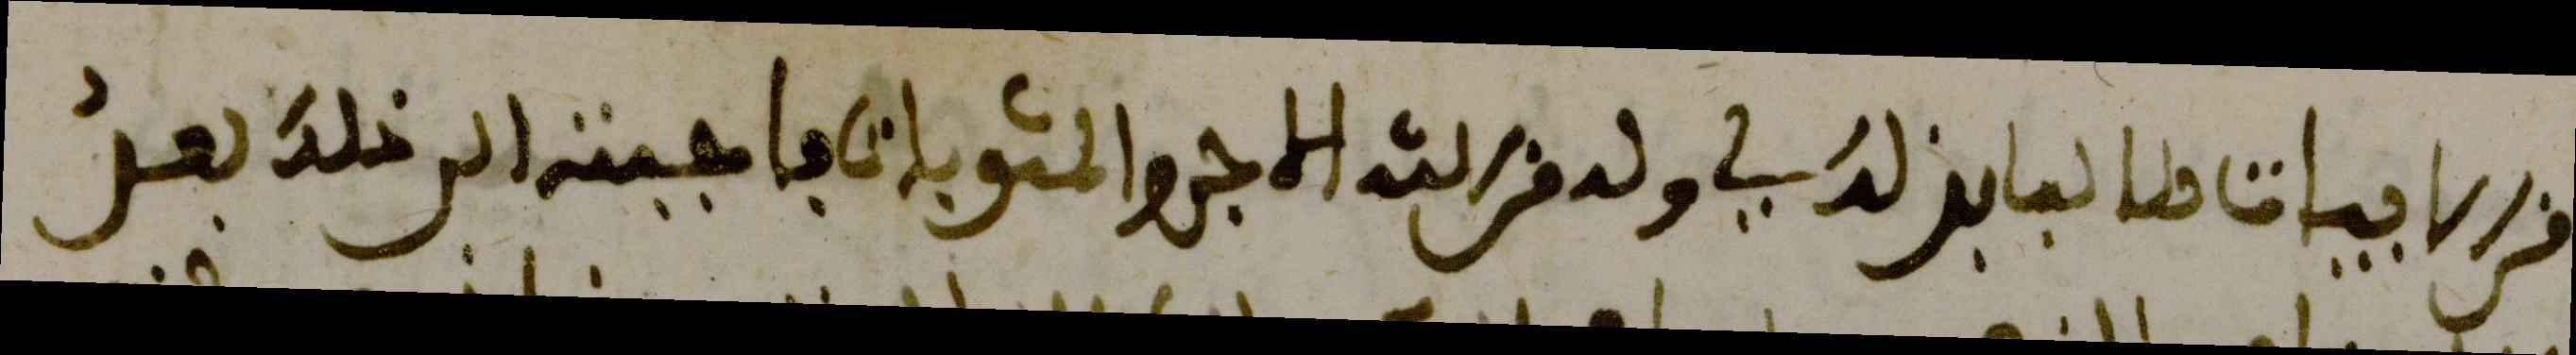من الابيات طالبا بذلك لي وله من الله الاجر والمثوبات فاجبته الى ذلك بعد
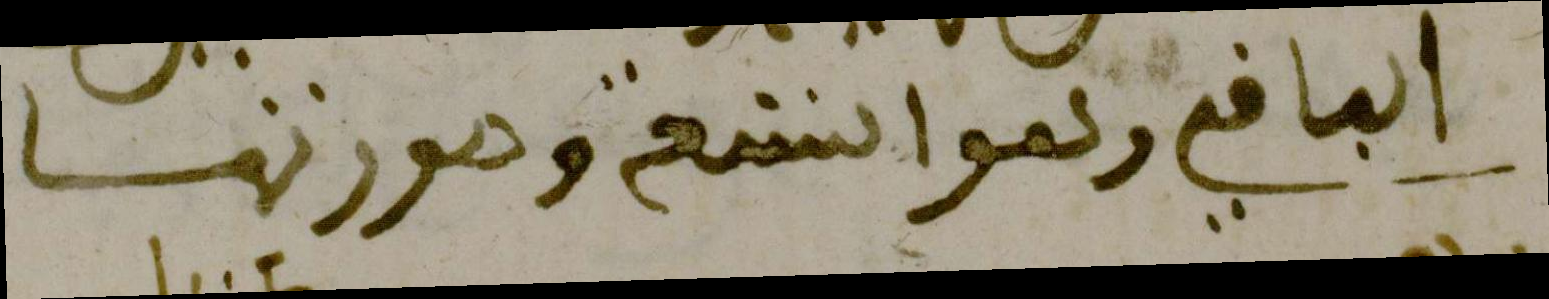الباقي وهو التسعة وصرتها
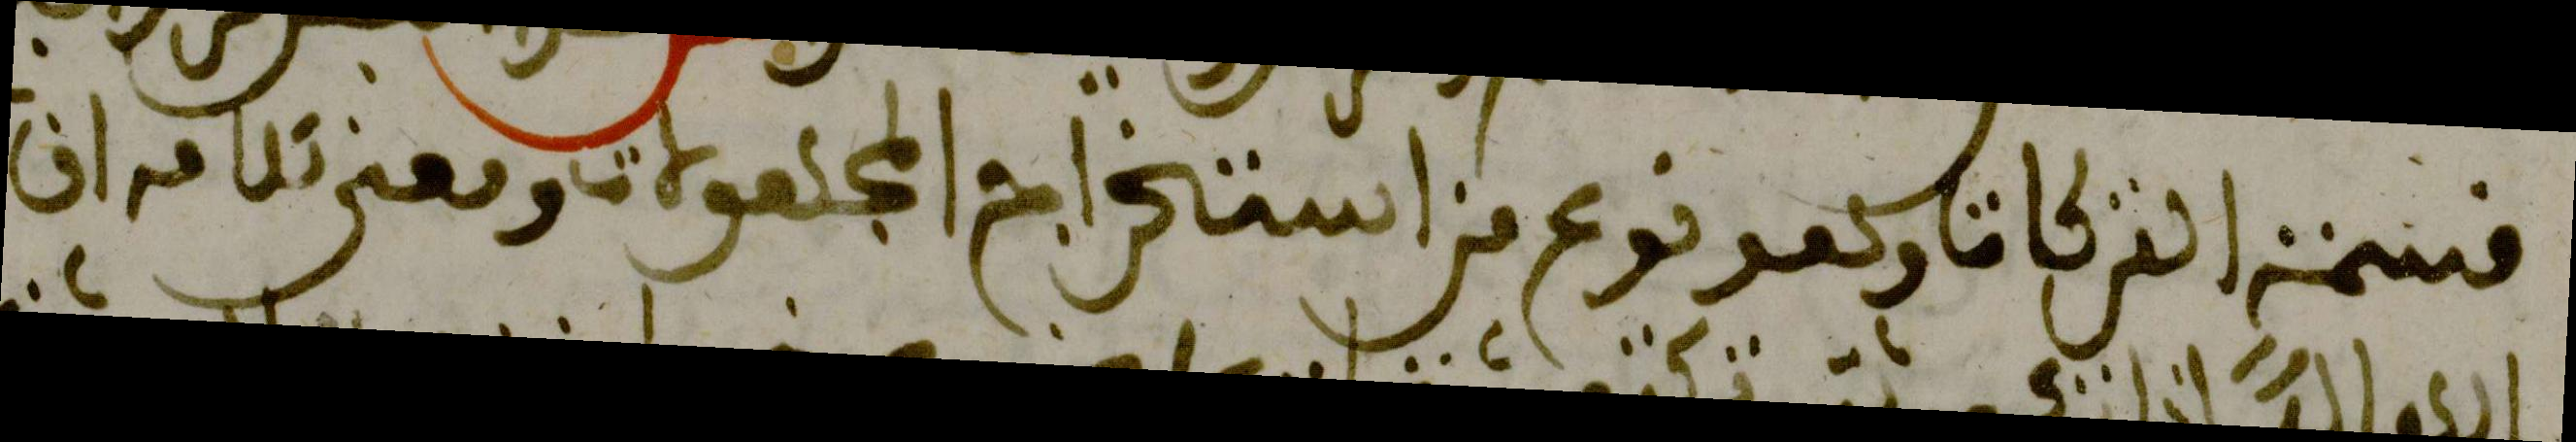قسمة التركات وهو نوع من استخراج الجهولات ومعنى كلامه ان
